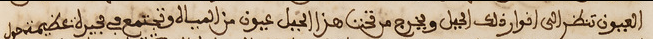العيون تنظر الى انوار ذلك الجبل ويخرج من تحت هذا الجبل عيون من المياه وتجتمع في بحيرة عظيمة حول
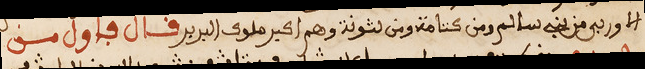الاوربى من بنى سالم ومن كتامة ومن لثونة وهم اكبر ملوك البربر قال فاول من
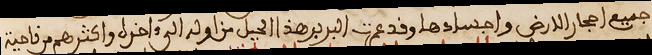جميع احجار الارض واجسادها وقد عمرت البربر هذا الجبل من اوله الى ءاخره واكثرهم من ناحية
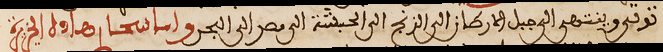توتى وينتهى الى جبل الاركان الى الزنج الى الحبشة الى مصر الى البحر واما سحارى هاده الجزيرة
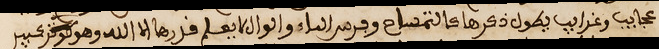عجايب وغرايب يطول ذكرها كالتمساح وفرس الماء والوال لا يعلم قررها الا الله وهو كوتر كبير
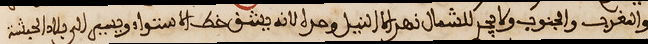والمغرب والجنوب ولايجرى للشمال نهر الا النيل وحده لانه يشق خط الاستواء ويسير الى بلاد الحبشة
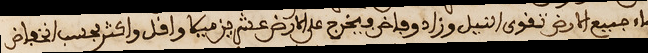ماء جميع الارض تقوى النيل وزاد وفاض فيخرج على الارض عشرين ميلا واقل واكثر بحسب انخفاض
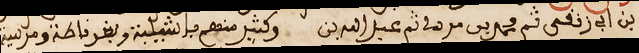بن ابي زنقى ثم محمد بن مردلى ثم عبد الله بن وكثير منهم باشبيلية وبغرناطة ومرسية
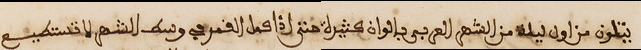يتلون من اول ليلة من الشهر العربى بالوان كثيرة حتى اذا كمل القمر في وسط الشهر لا تستطيع
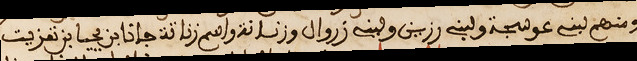ومنهم لبنى عوسجة ولبنى رزين ولبنى زروال وزنانة واسم زناتة جانا بن يحيا بن تعزيت
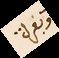ونفرة
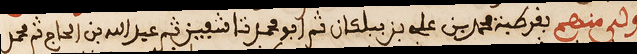ولى منهم بقرطبة محمد بن على بن ببلكان ثم ابو محمد تاشفين ثم عبد الله بن الحاج ثم محمد
